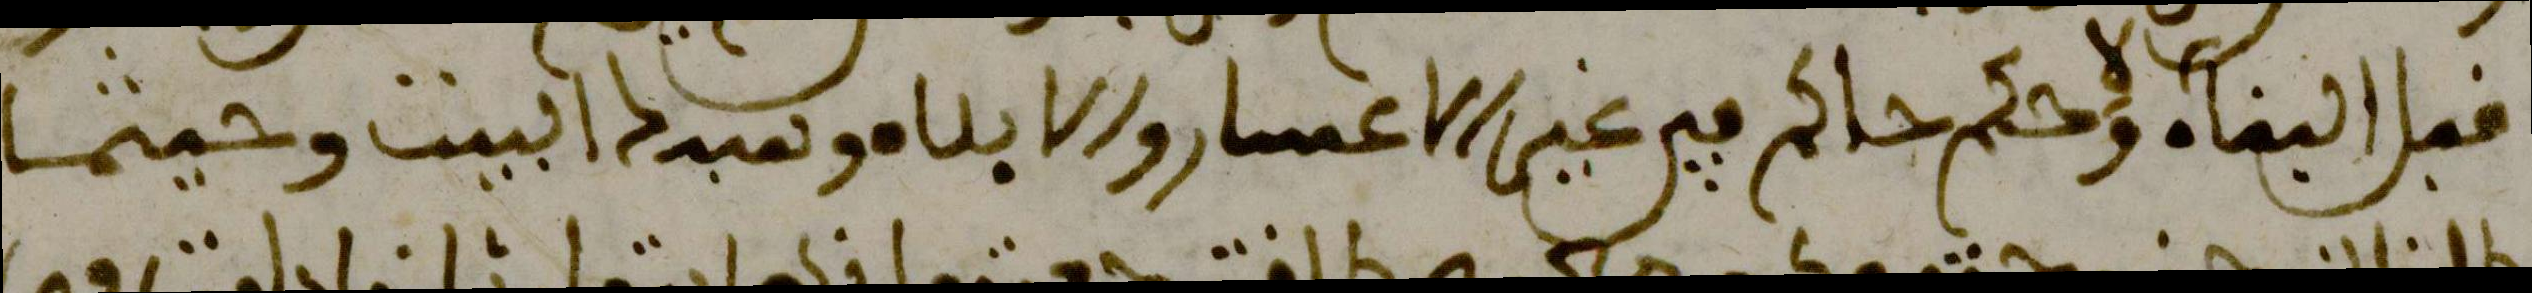قبل البناء و حكم حاكم في غير الاعسار و الايلاء و سبك البيت و حيثما
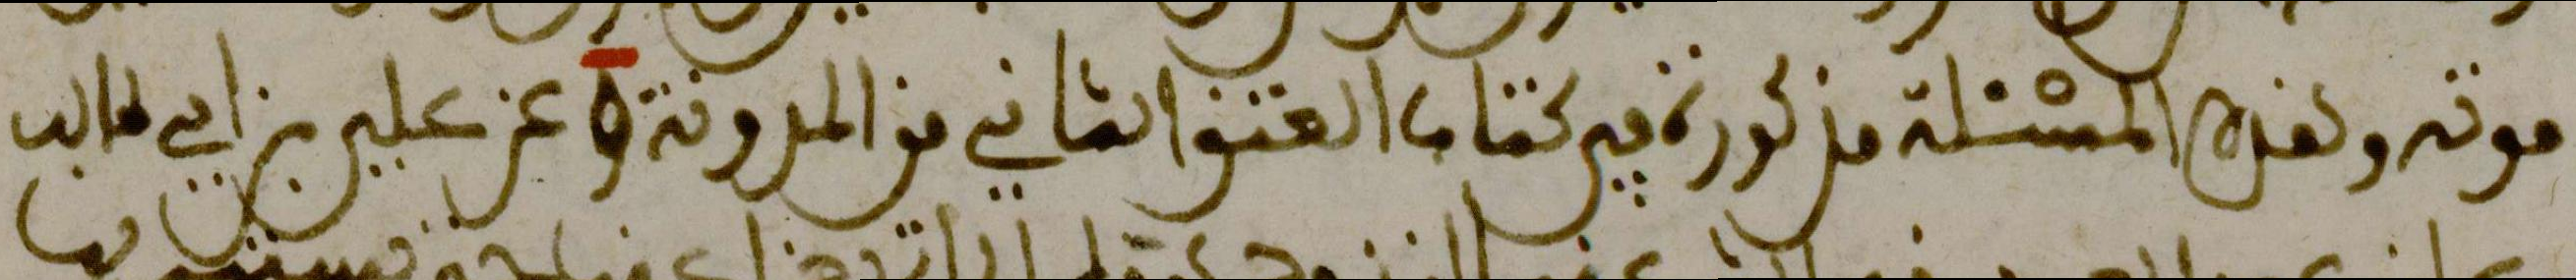موته و هذه المسئلة مذكورة في كتاب العتق الثاني من المدونة و عن علي بن ابي طالب
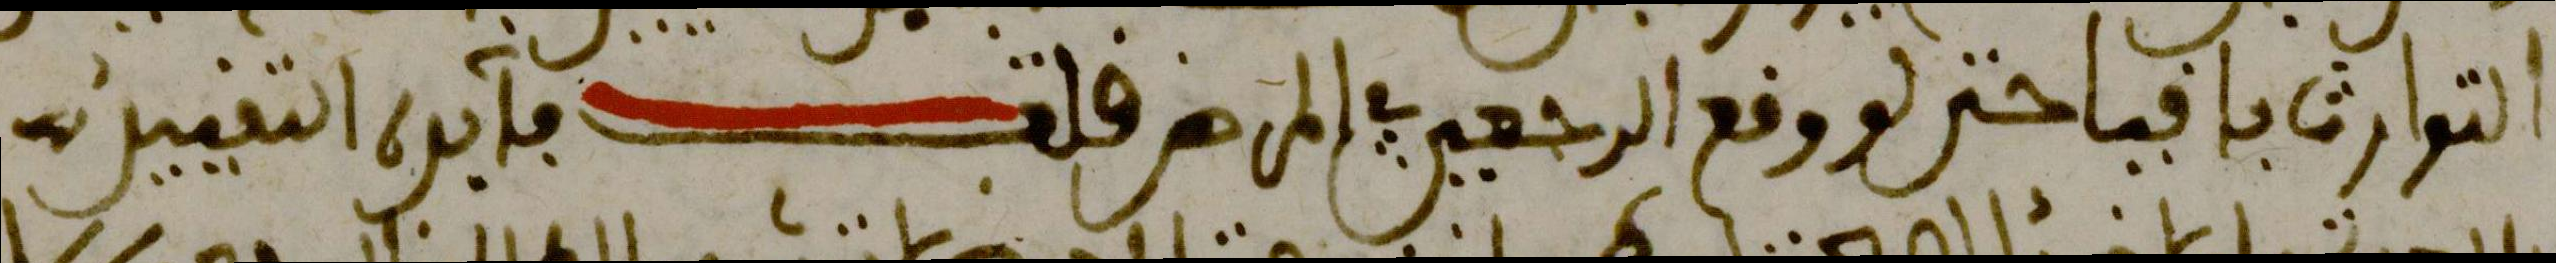التوارث باقيا حتى لو وقع الرجعي في المرض قلت فائدة التقييد
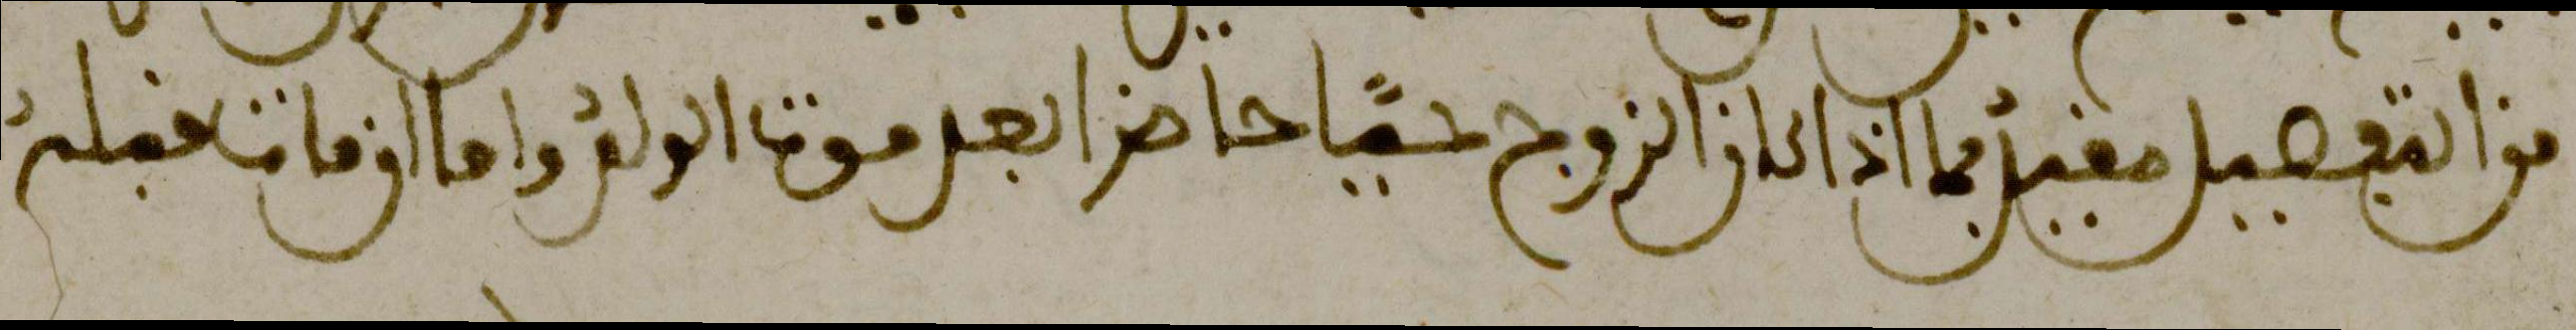من التفصيل مقيد بما اذا كان الزوج حيا حاضرا بعد موت الولد و اما ان ما قبله
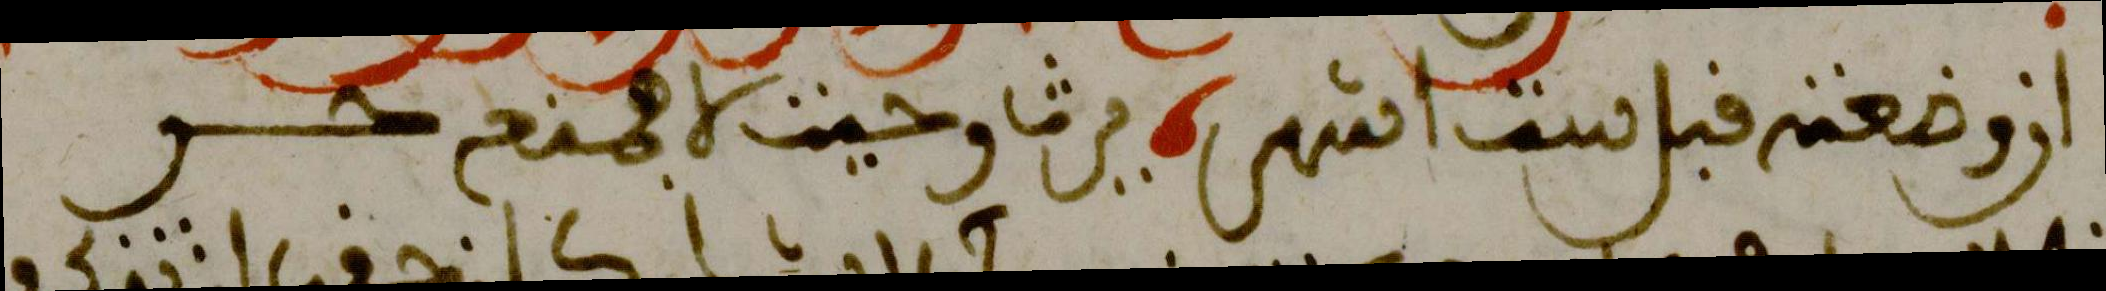ان وضعته قبل ست اشهر يرث و حيت لا يمنعه حر
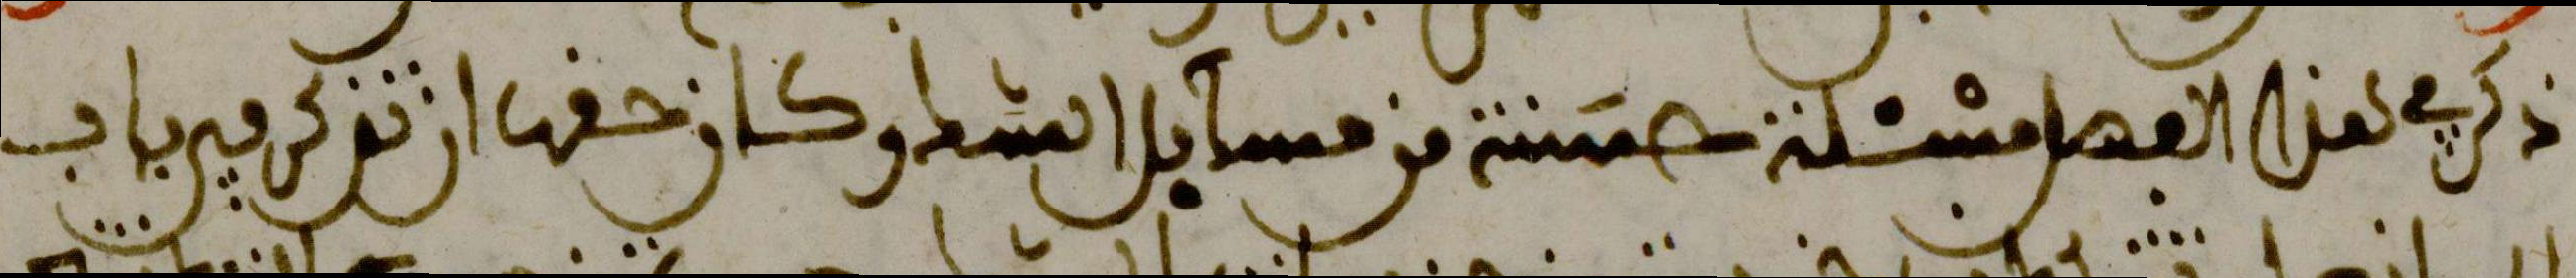ذكر في هذا الفصل مسئلة حسنة من مسائل الشك و كان حقها ان تذكر في باب
